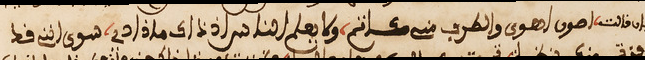بان قالت اصوى اهوى والطرف منى مكاتم ولا يعلم الناس اذ ذاك ما ذادي سوى اننى قد
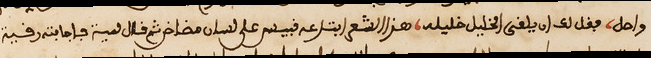واحد فقل لك ان يلقى الخليل خليله هذا الشعر ابتدعه قبيس على لسان مضاض ثم قال لمية فاجابته رقية
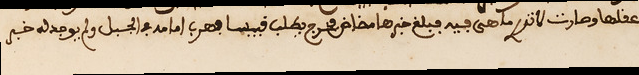عقلها وصارت لما تدرى ما هي فيه فبلغ خبرها مضاض فخرج يطلب قبيسا فهرب امامه في الجبل ولم يوجد له خبر
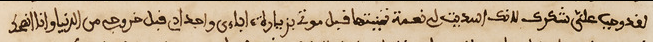لقد وجب علىّ شكرك لانك اسديت لى نعمة تمنيتها قبل موتى بزيارة ءاباءى واجدادى قبل خروجى من الدنيا وانا انصحك
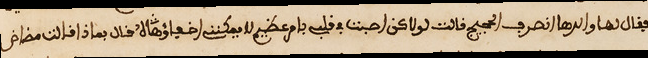فقال لها والدها انصرف الحجيج قالت لولا كن احبت في قلبى بامر عظيم لا يمكننى اخفاؤهاه قال بماذا قالت مضاض
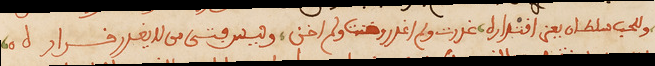وللحب سلطان يعز اقتداره غررت ولم اغررو # ولم اخن وليس فتى من لا يغرر قراره
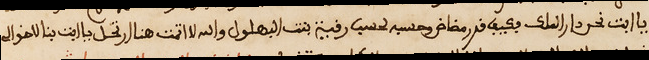يا ابت نحن دار الملك فكيف قد رمضاض وحسبه لحسب رقية بنت البهلول ولله لا اتمت هنا ارتحل يا افت بنا لاخوالى
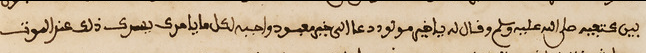بين كتفيه صلى الله عليه وسلم وقال له يا خير مولود دعا الى خير معبود واجبه لكل ما يامرك يسرك ذلك عند الموت
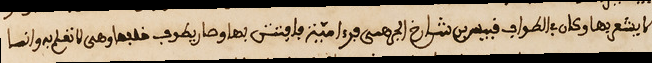لا يشعر بها وكان في الطواف قبيس بن شارخ الجرهمى فر ءاميّة فافتتن بها وصار يطوف خلفها وهي لا تعلم به انما
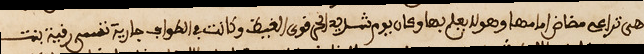هي تداعى مضاض امامها وهو لا يعلم بها وكان يوم شديد الحر قوى الغيظ وكانت في الطواف جارية تسمى رقية بنت
